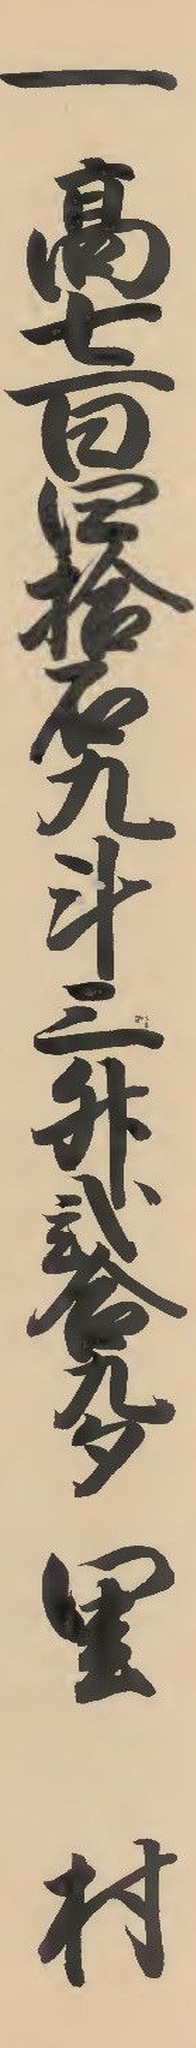一高七百四拾石九斗三升弐合九勺里村
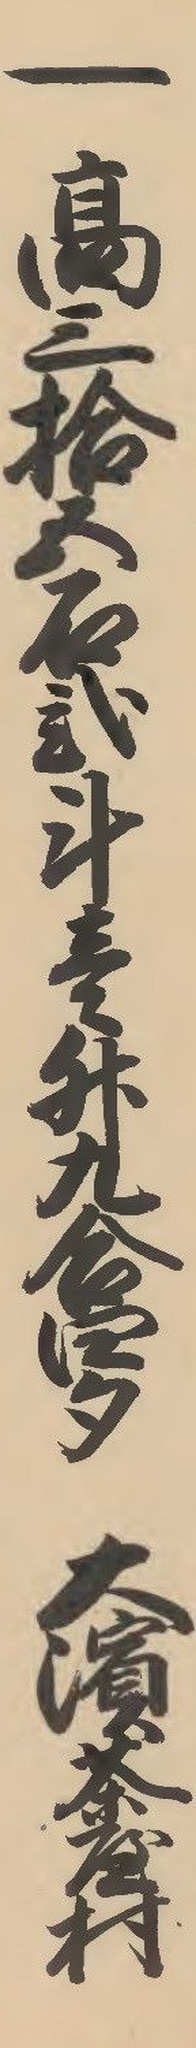一高三拾五石弐斗壱升九合四勺大浜茶屋村
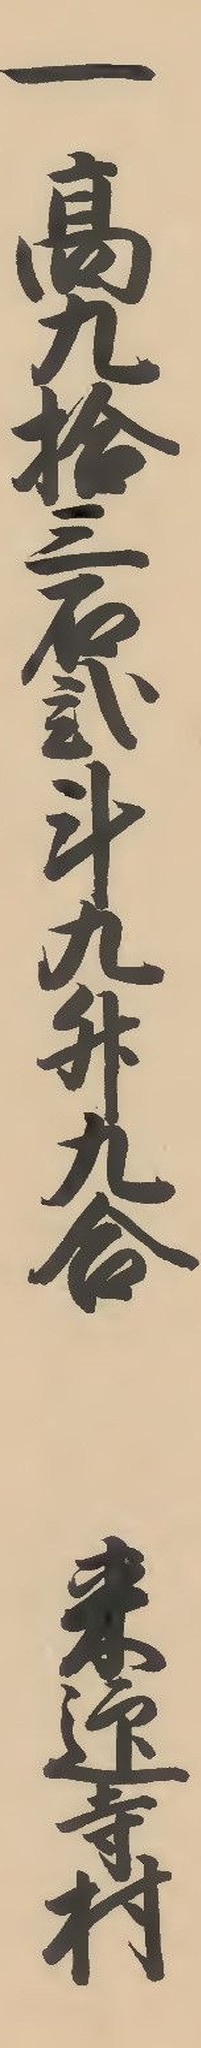一高九拾三石弐斗九升九合来迎寺村
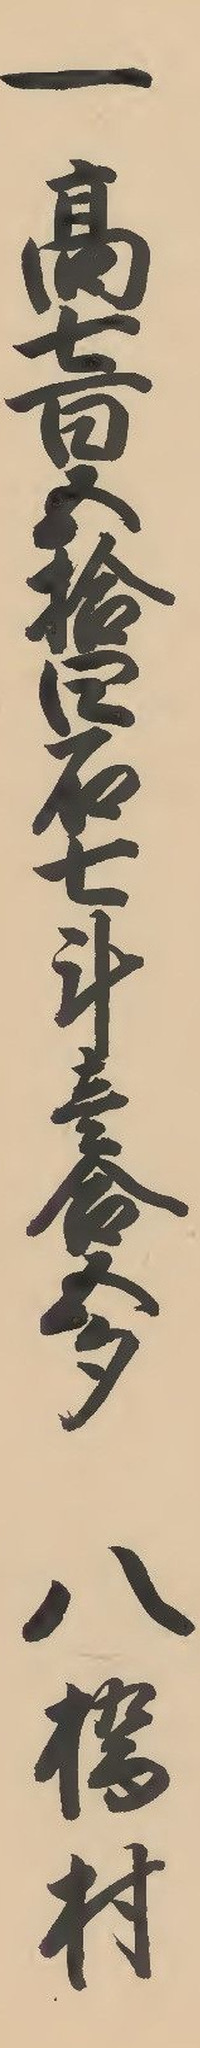一高七百五拾四石七斗壱合五勺八橋村

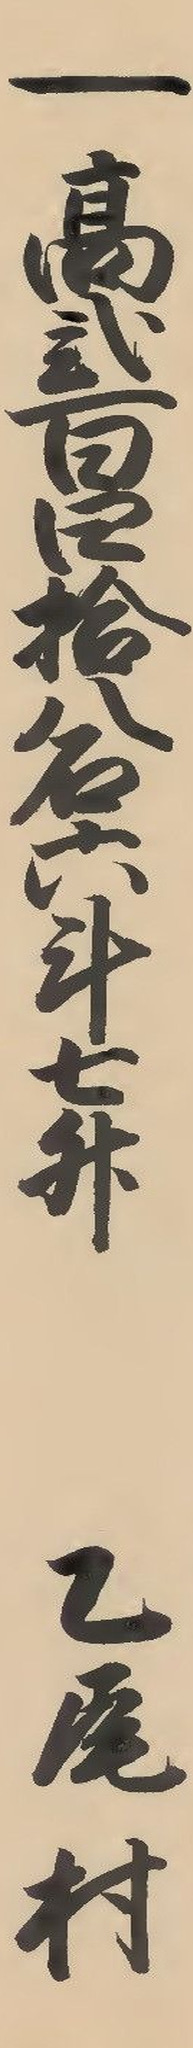一高弐百四拾八石六斗七升乙尾村
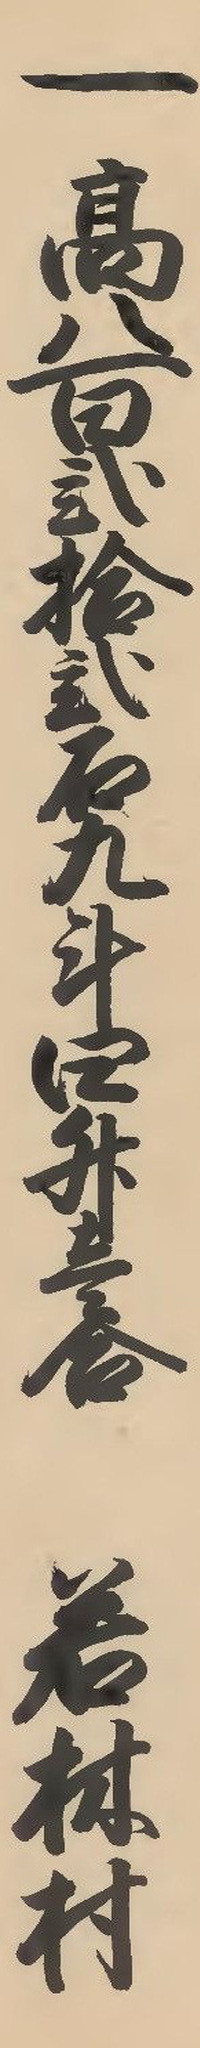一高八百弐拾弐石九斗四升壱合若林村
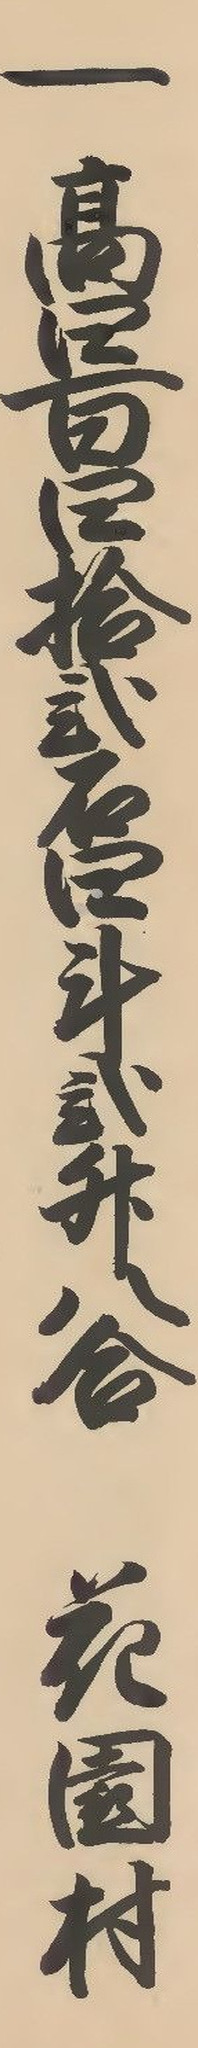一高四百四拾弐石四斗弐升八合花園村
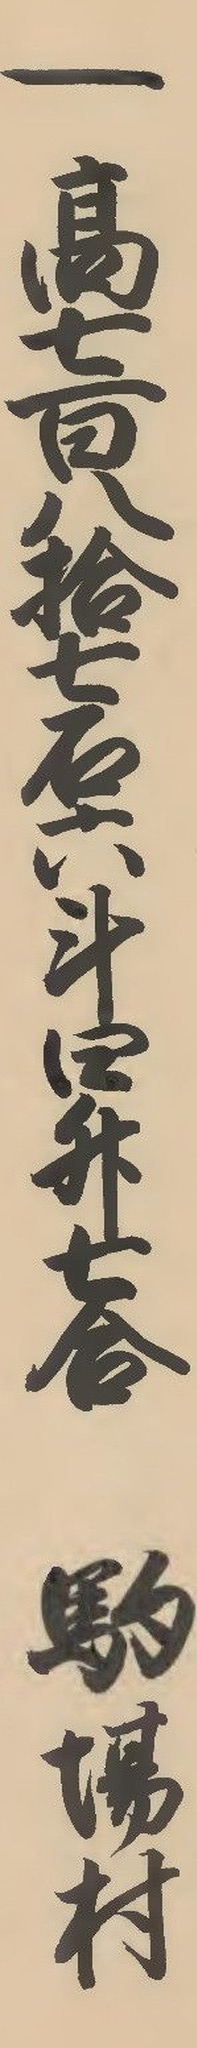一高七百八拾七石六斗四升七合駒場村
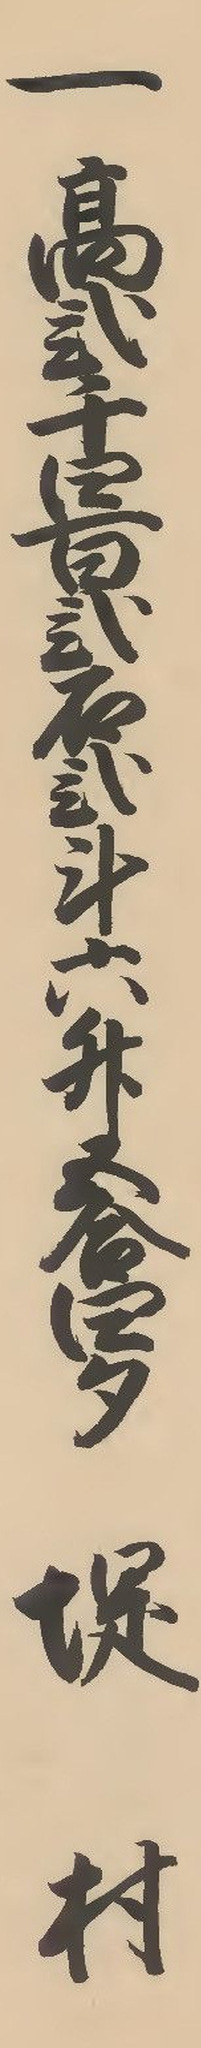一高弐千四百弐石弐斗六升五合四勺堤村
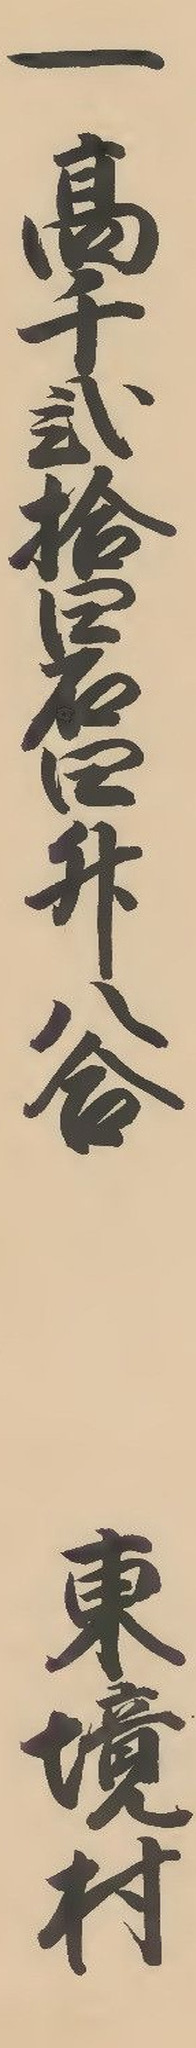一高千弐拾四石四升八合東境村

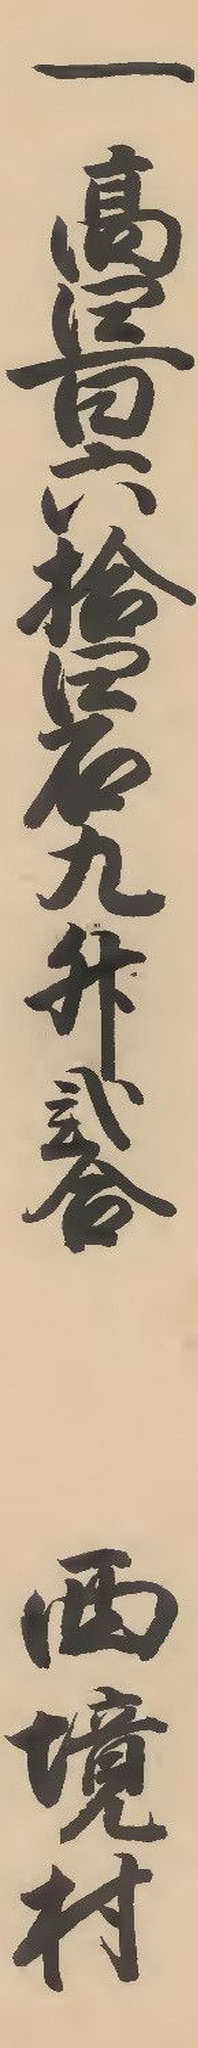一高四百六拾四石九升弐合西境村
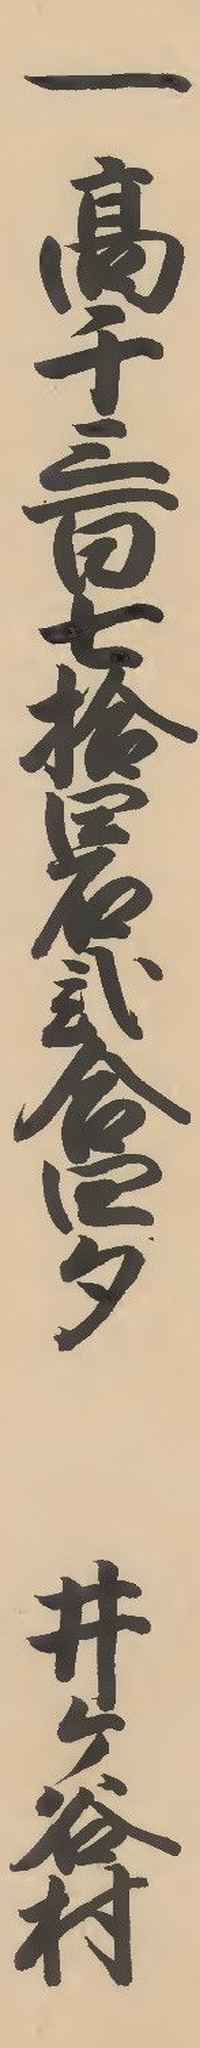一高千三百七拾四石弐合四勺井ヶ谷村
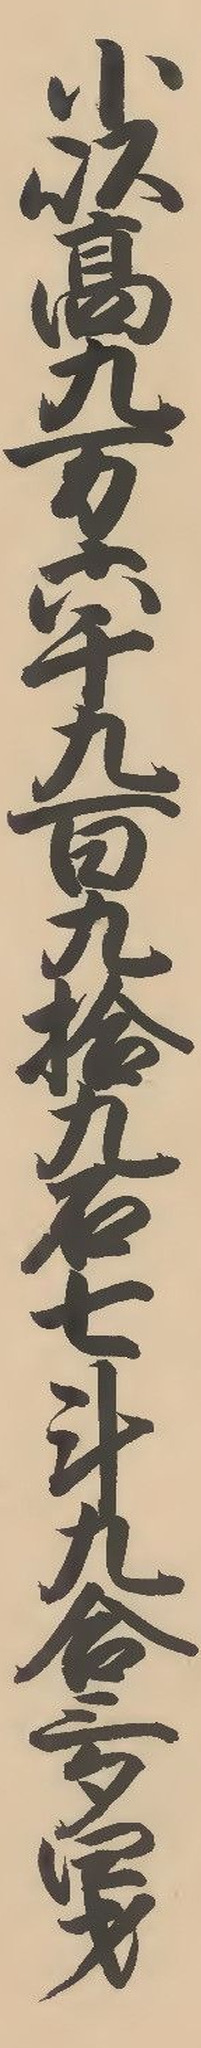小以高九万六千九百九拾九石七斗九合三勺四才
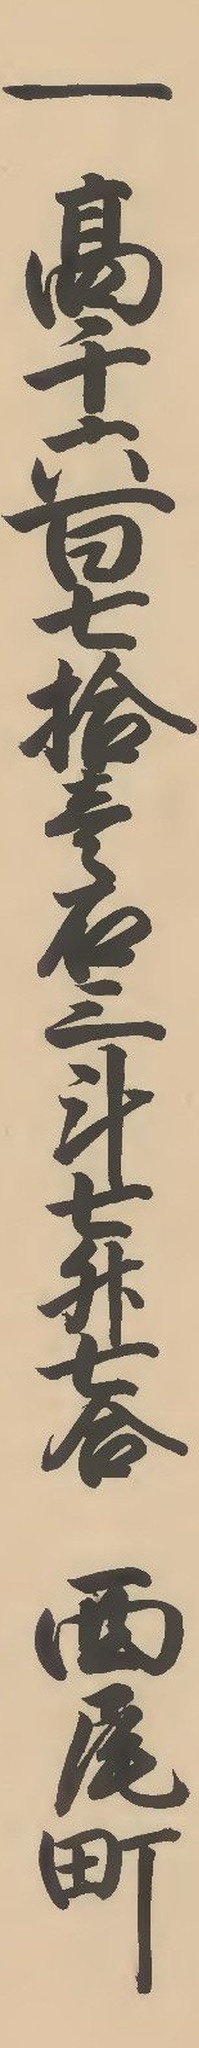一高千六百七拾壱石三斗七升七合西尾町
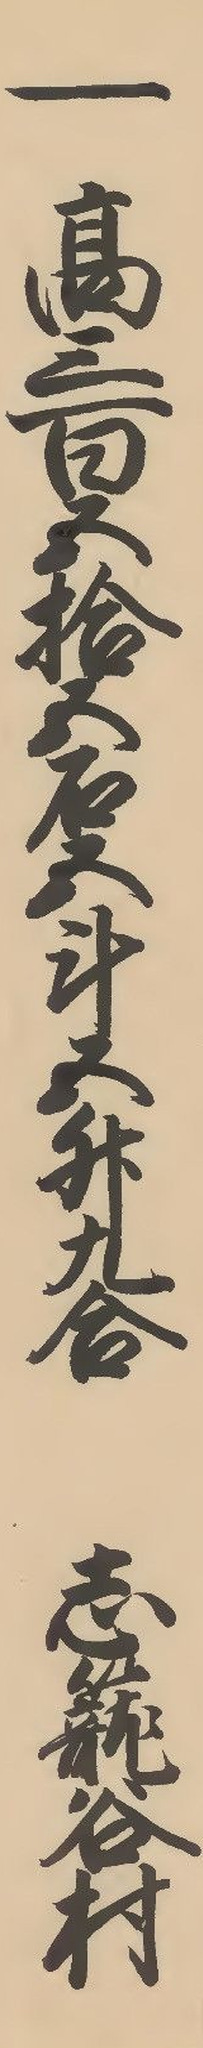一高三百五拾五石五斗五升九合志籠谷村
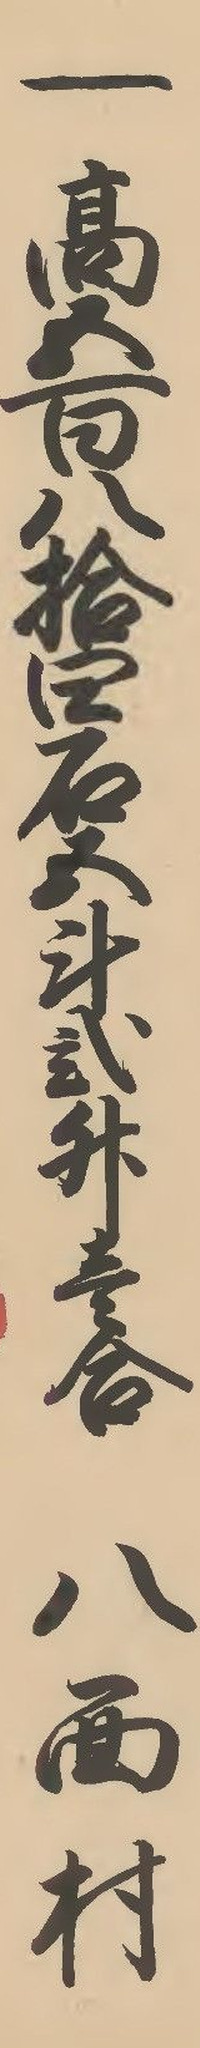一高五百八拾四石五斗弐升壱合八西村
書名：三河国郷帳
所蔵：国立公文書館 National Archives of Japan
